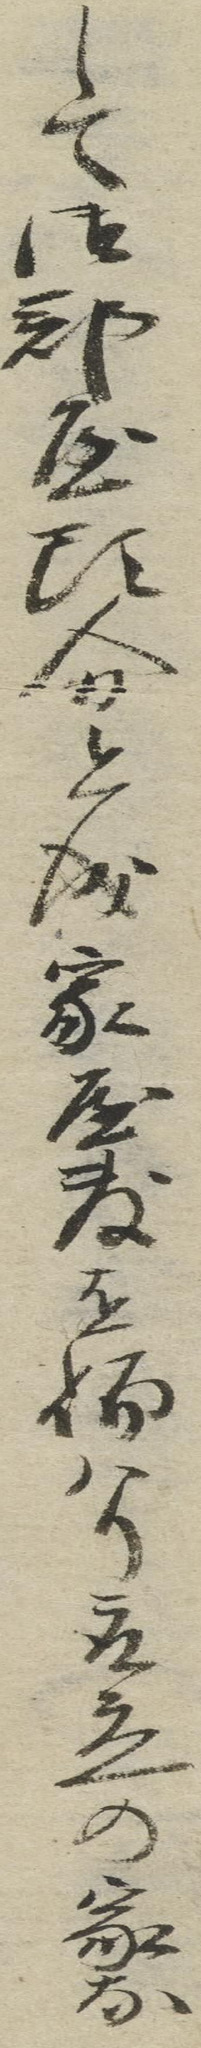して御部屋頭分と成家屋敷を賜ハり取立の家な
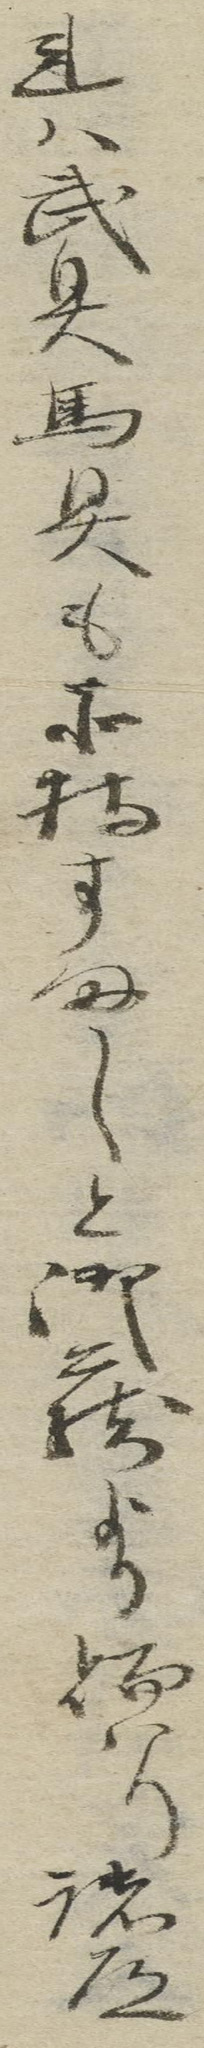れハ武具馬具も所持すましと御蔵より賜ハり諸道
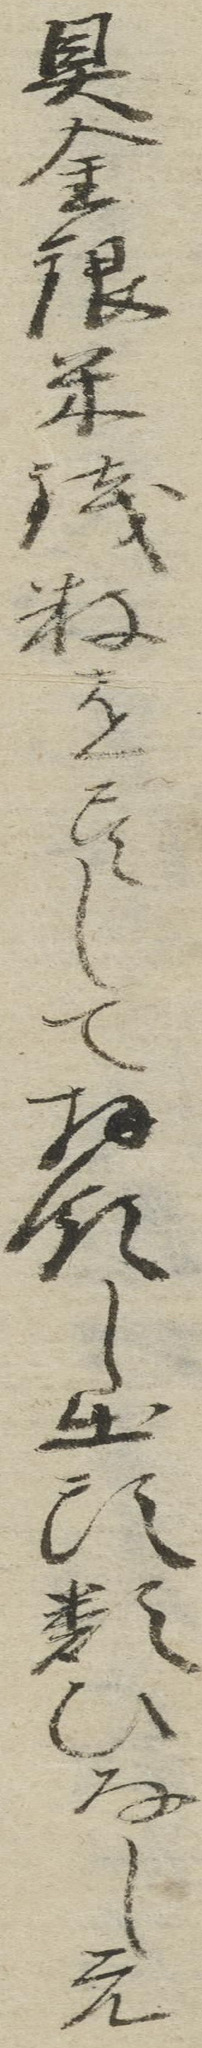具金銀米銭数を尽して拝領し出頭類ひなし元
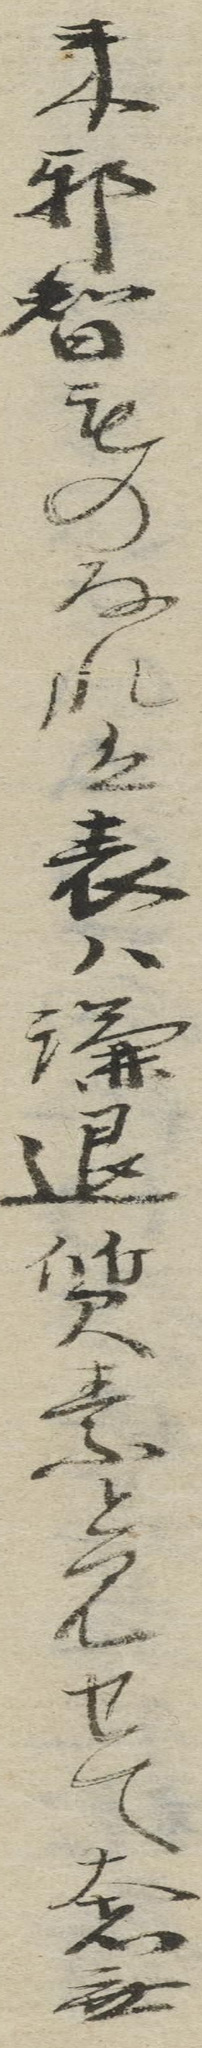来邪智ものなれは表ハ謙退質素と見セて奢無
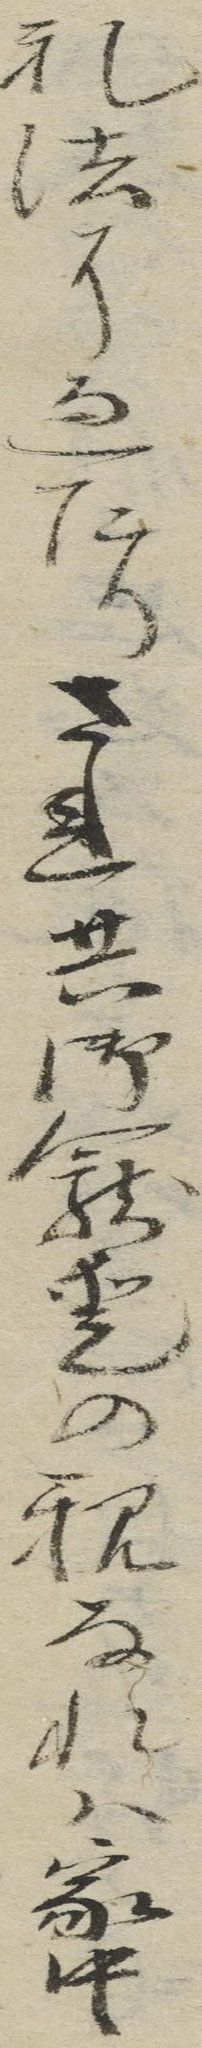礼法に過たりされ共御寵愛の親なれハ家中
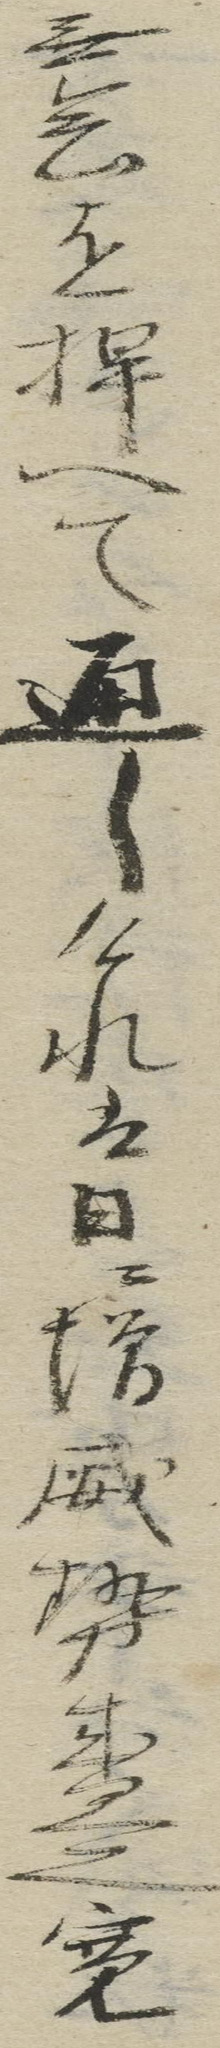無念を捍へて通しけれは日ニ増威勢盛也寛
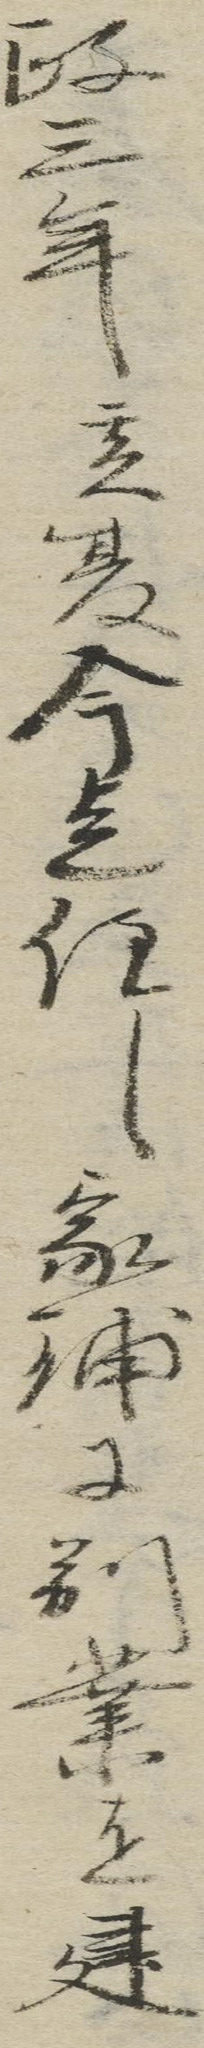政三年亥夏今迄住し家鋪に別業を建
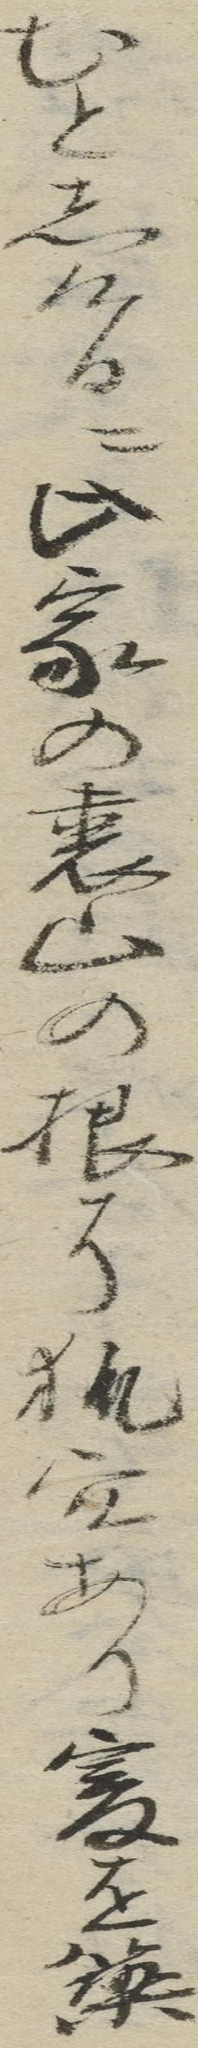むとしけるに此家の裏山の根に狐穴あり爰を築
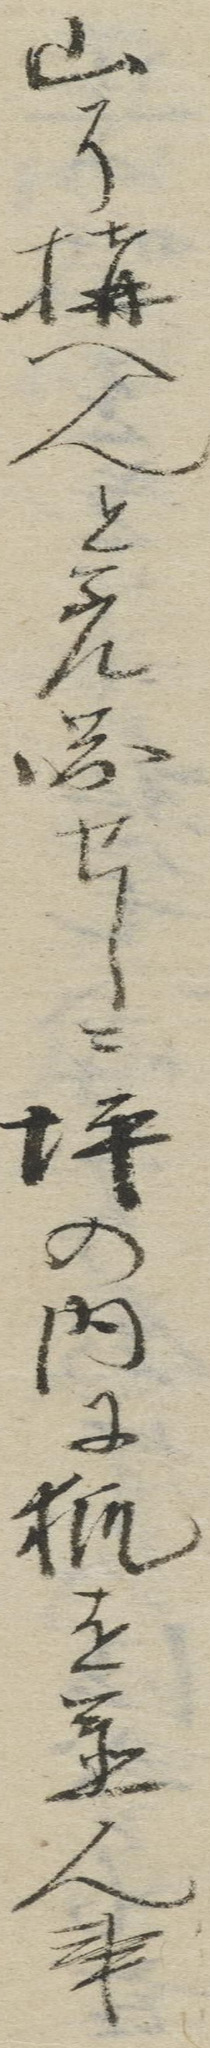山に構へんと差図セしニ坪の内に狐を置ん事
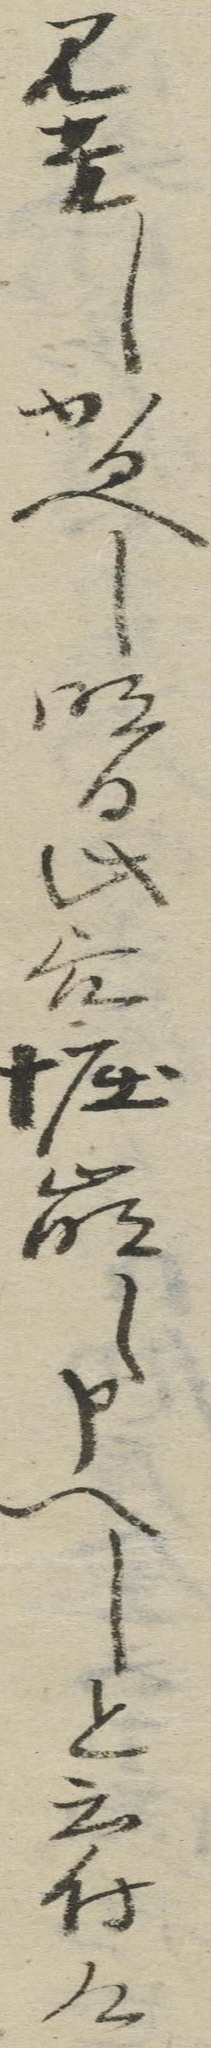見苦しかるへし明日此穴堀崩し申へしと云付け
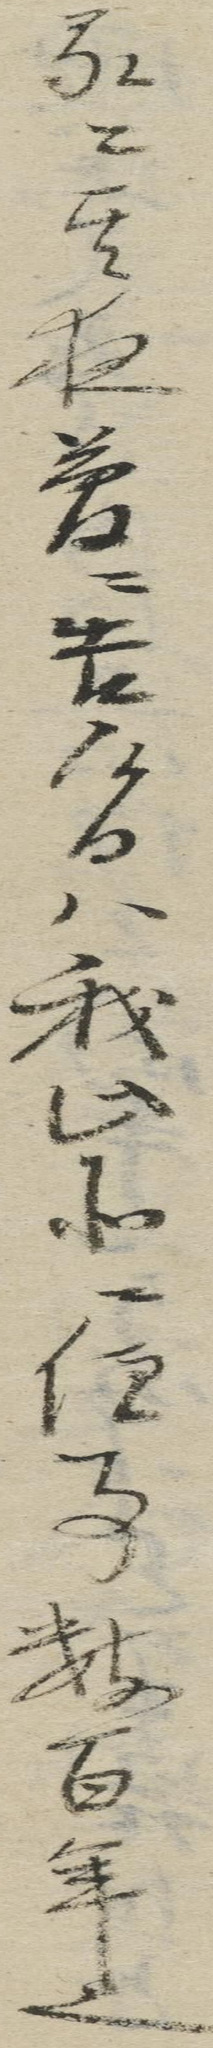るニ其夜夢に告たるハ我此所ニ住事数百年也
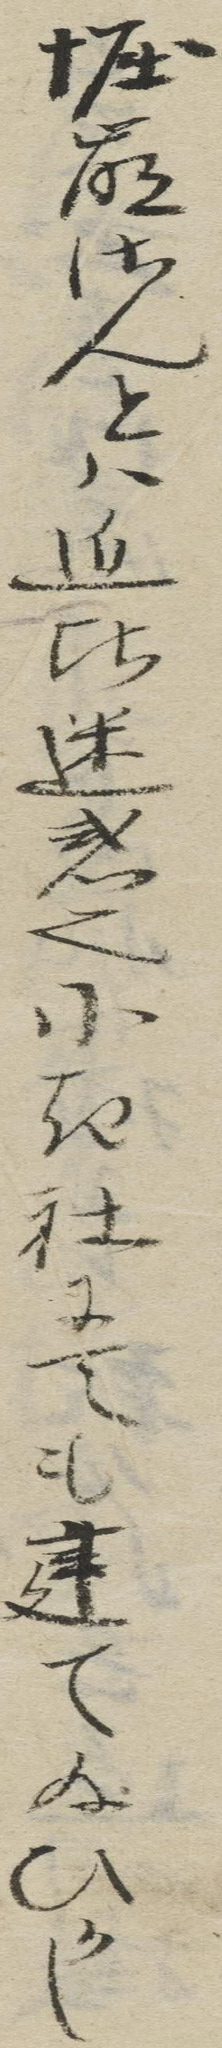堀崩さんとハ近比迷惑也小き社にても建て給ひかし
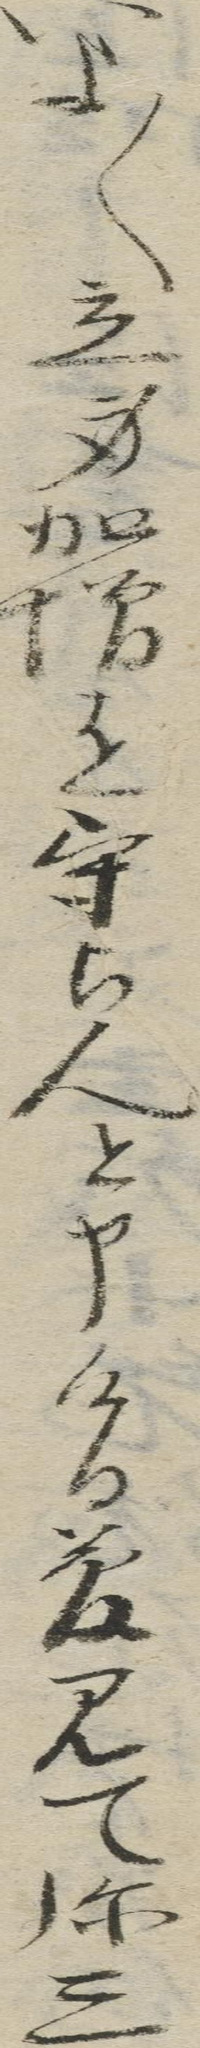いよ〳〵立身加増を守らんと申ける夢見て弥三
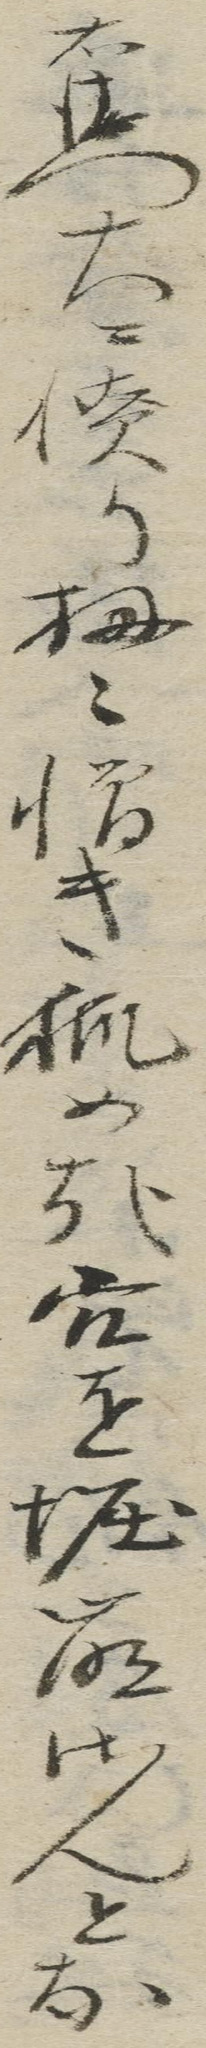右衛門大ニ憤り扨〻憎き狐め哉穴を堀崩さんとな
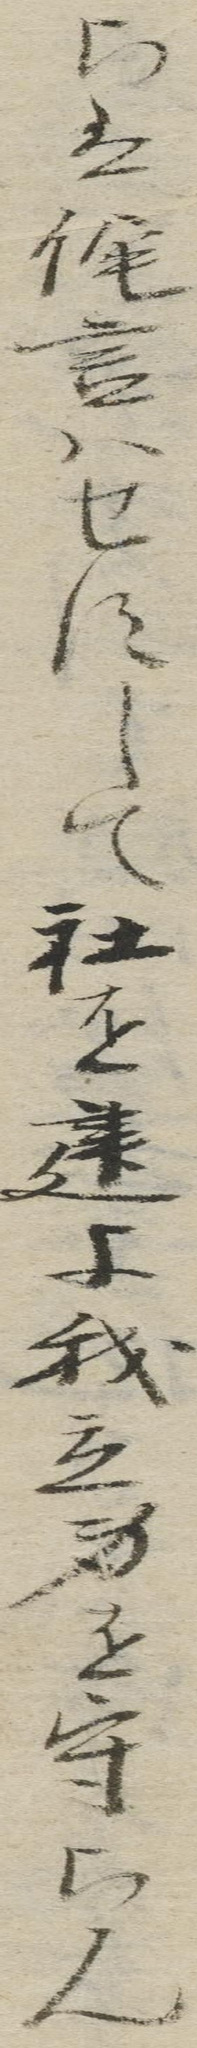らは詫言ハセすして社を建よ我立身を守らん
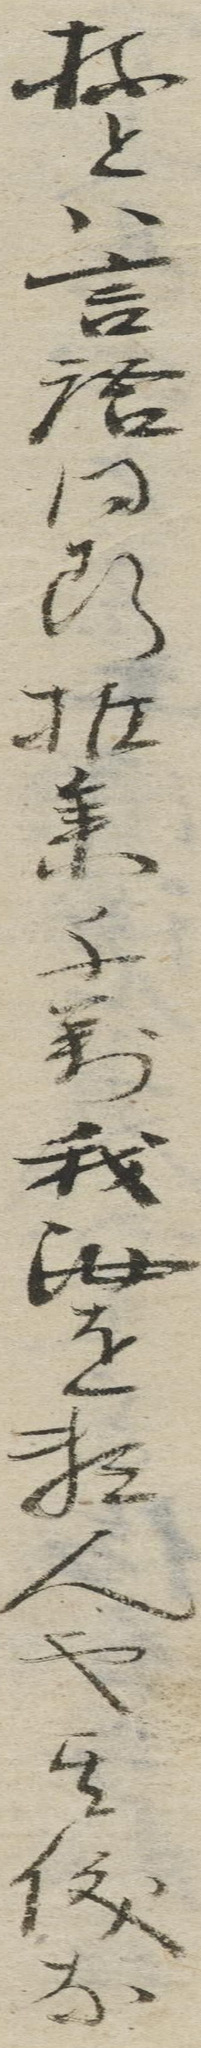抔とは言語同断推参千萬我汝を頼んや其儀な
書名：肥前國島原領普賢山大変記　完
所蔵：東京大学地震研究所図書室 Earthquake Research Institute Library, The University of Tokyo, JAPAN
